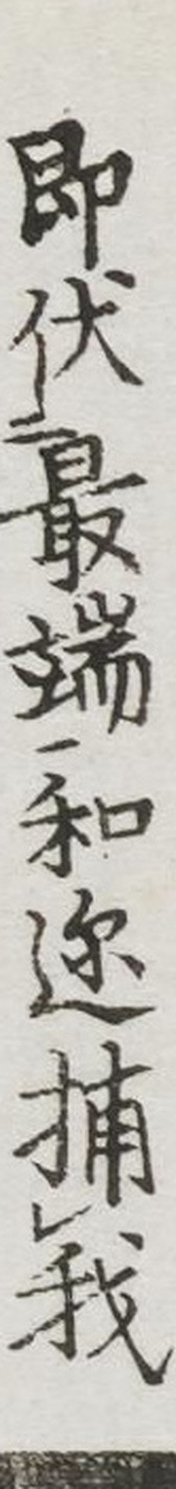即伏最端和迩捕我
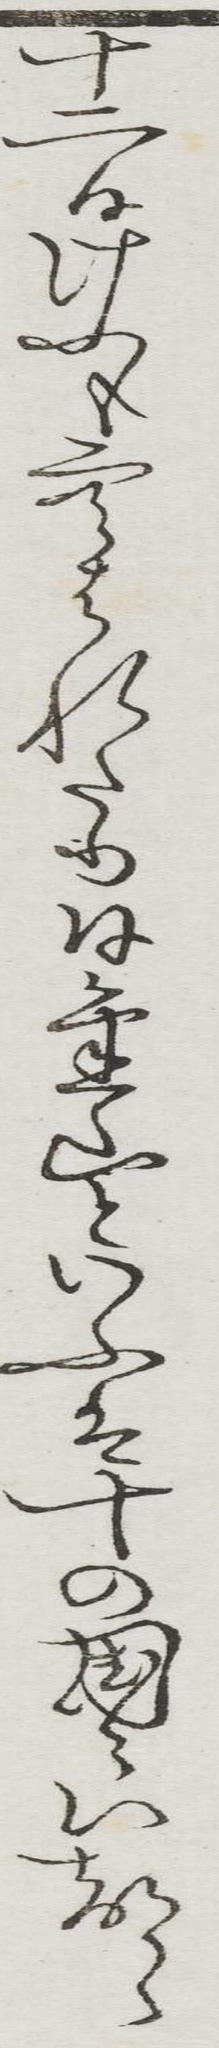十二日けふも空はれたり日金山といふは十の国々いつら
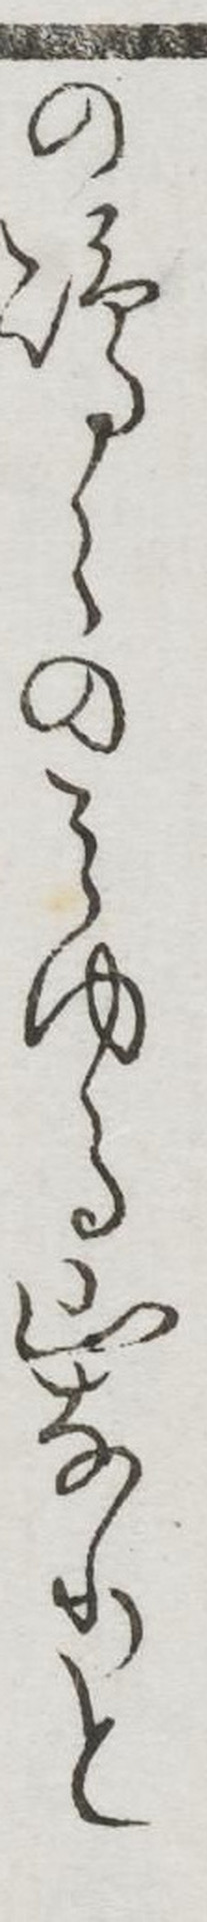の嶋々のみゆる山なりと
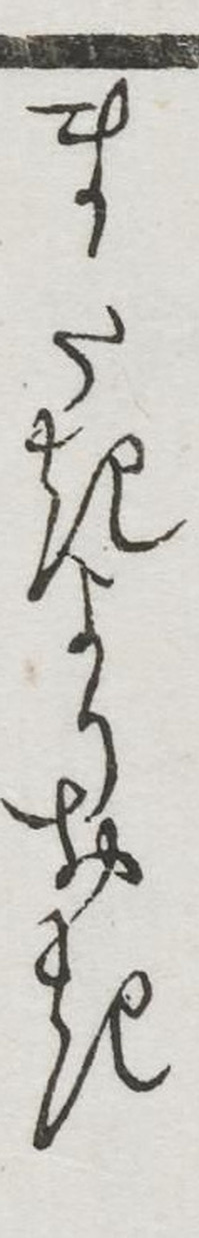またきよりおき
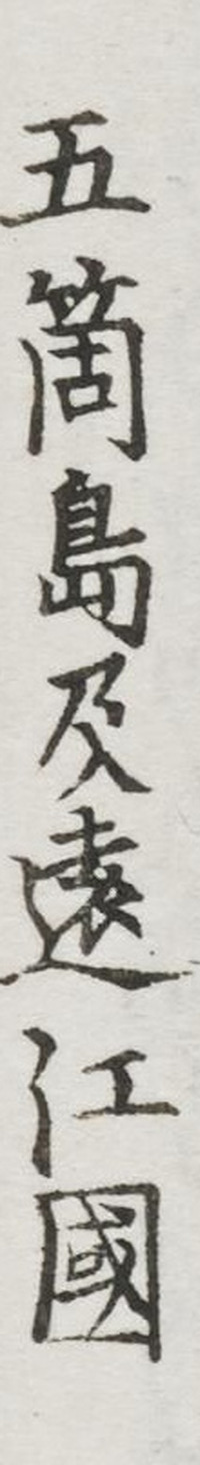五箇島及遠江国
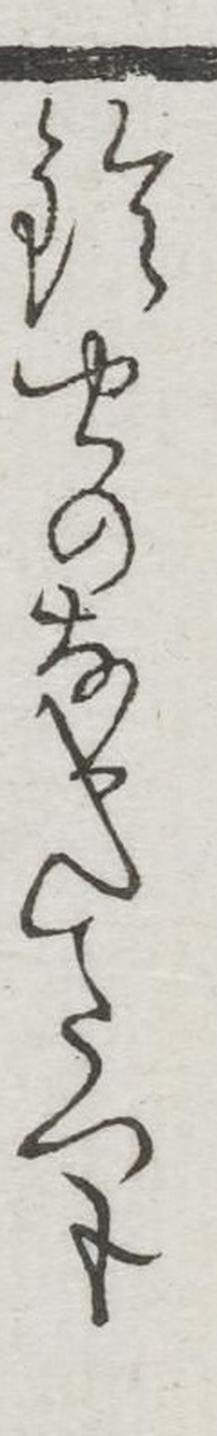鈴虫のなきたつも
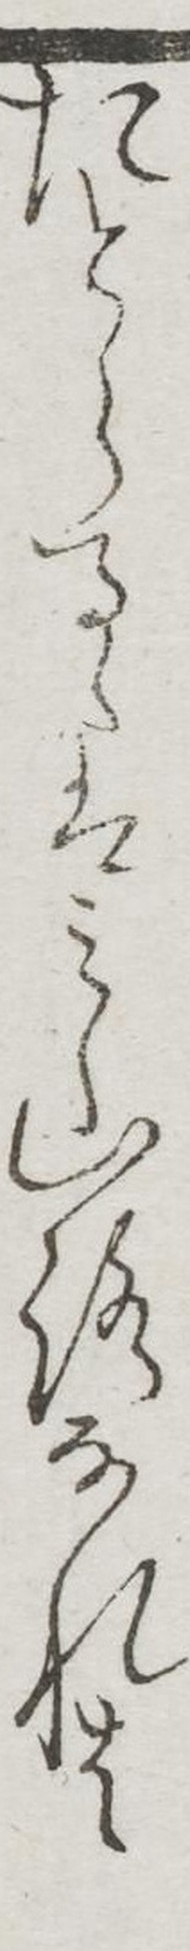たとらるゝは山路なれは
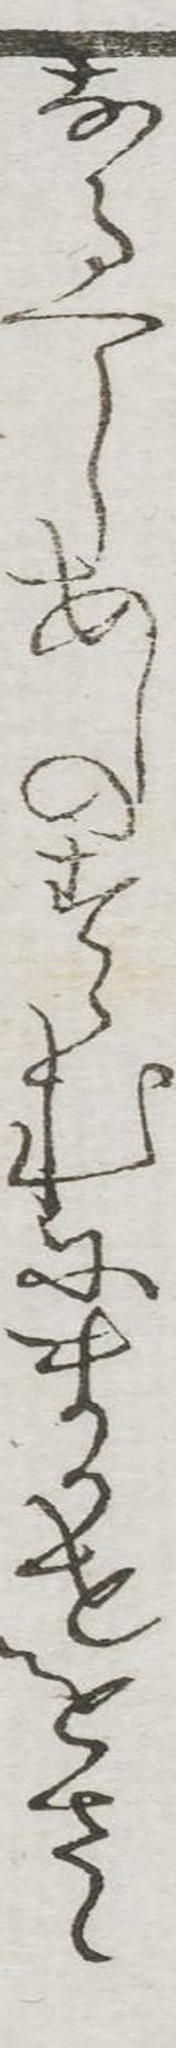なるへしあしのすゝむにまかせをさゝ
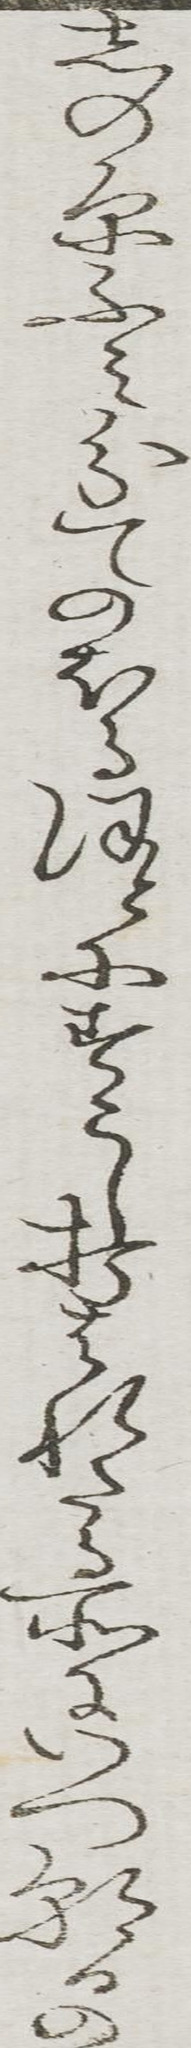しの原ふみ分てのほるほとにすこし打はれたる所にいつ朝日の
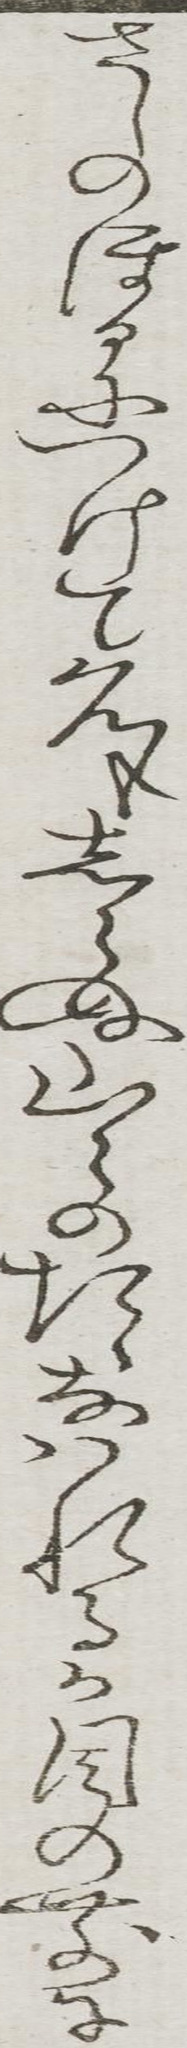さしのほるにつけて名もしらぬ山々のたゝなはれるか目の前に

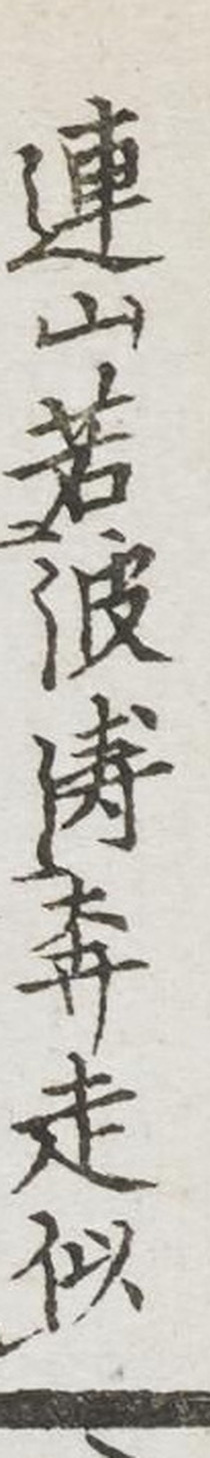連山若波涛奔走似
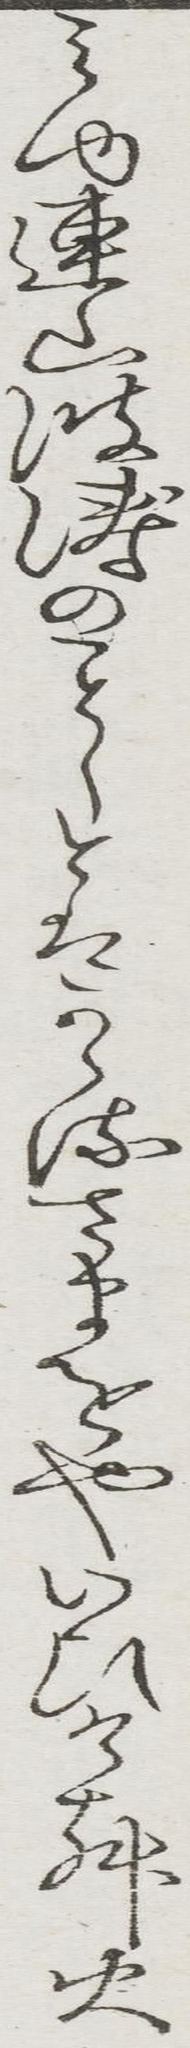みゆ連山波涛のことしとはかゝるさまをやいひけむ火
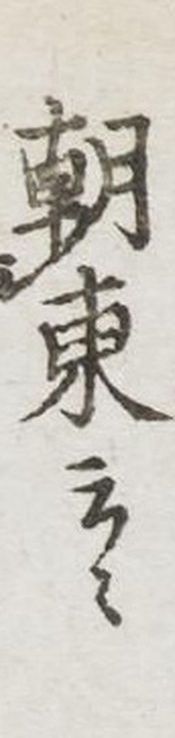朝東云々
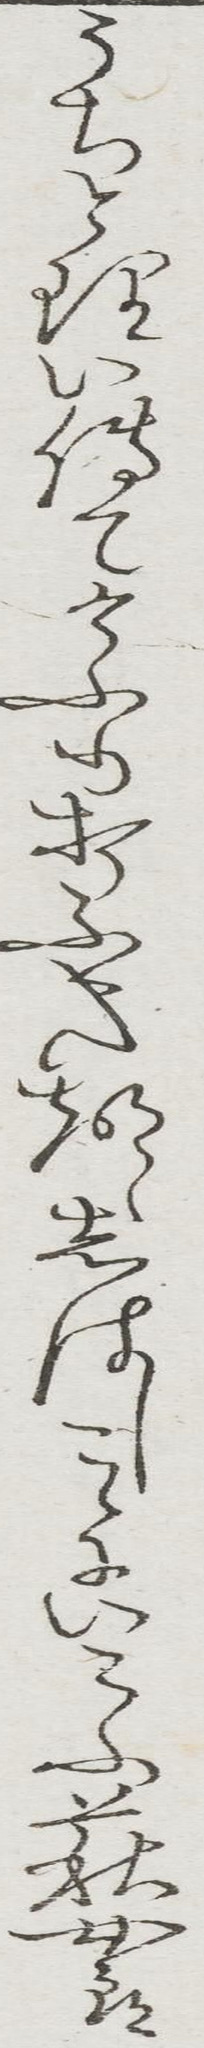うちとりいててけふり打ふきつゝしはしこゝにいこふ萩女郎
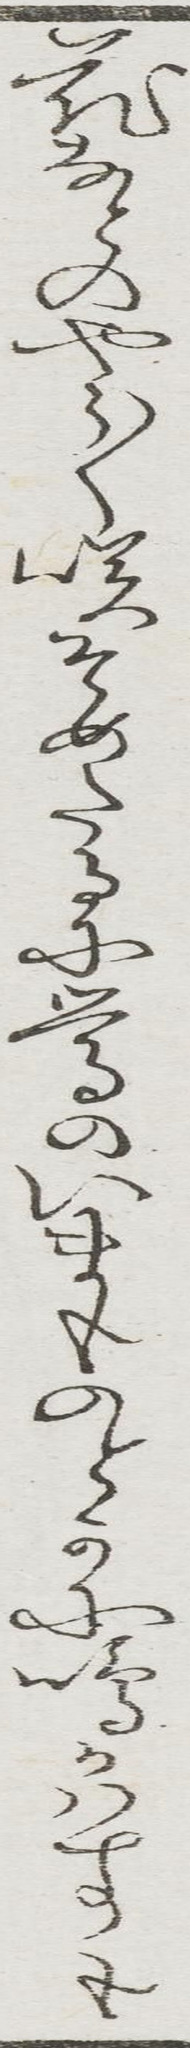花なとのやう〳〵咲そめたるに鴬のいまものとかに鳴かはすも
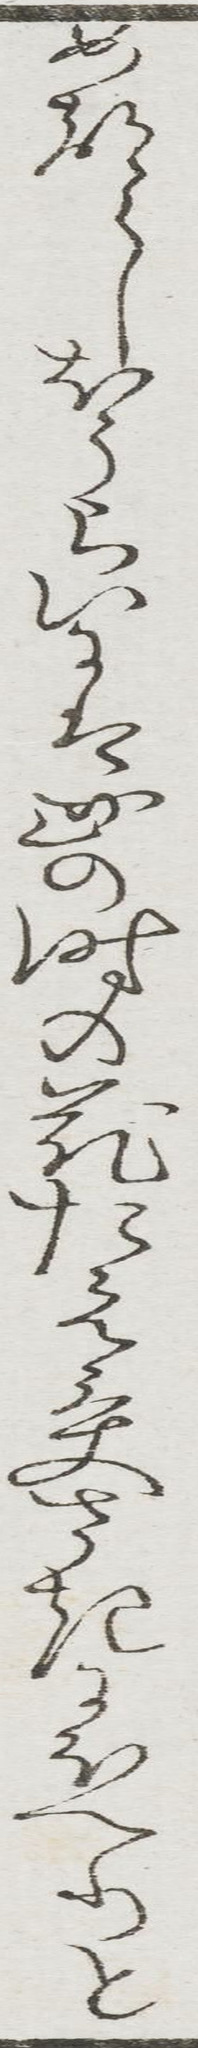めつらしほうらいには四の時の花たえすさきにほへりと
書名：挿画熱海日記　全
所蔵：東京大学地震研究所図書室 Earthquake Research Institute Library, The University of Tokyo, JAPAN
